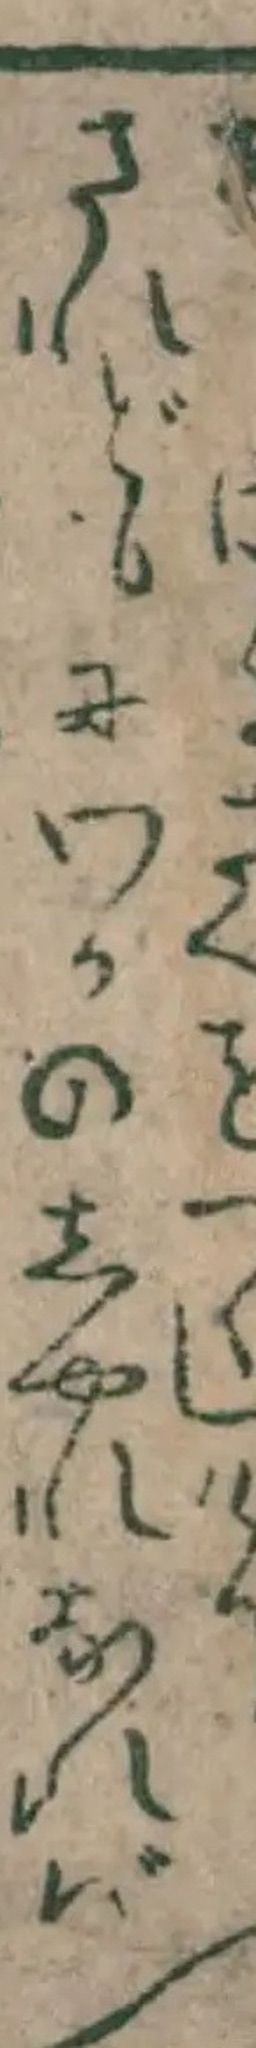されどもにわかのしやれなれば
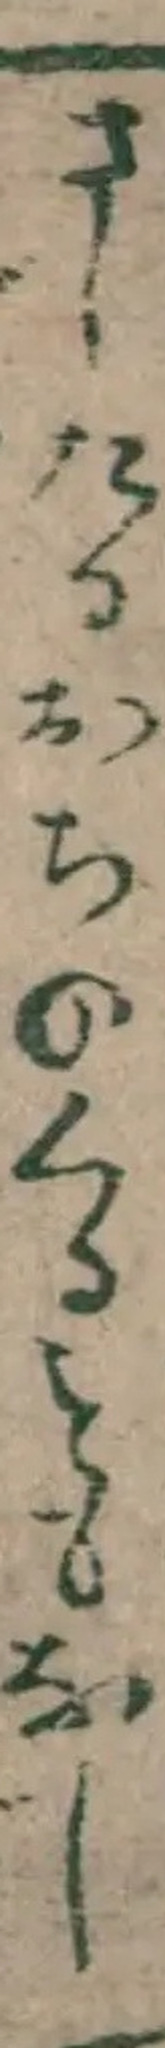さしたるおちのくることもなし
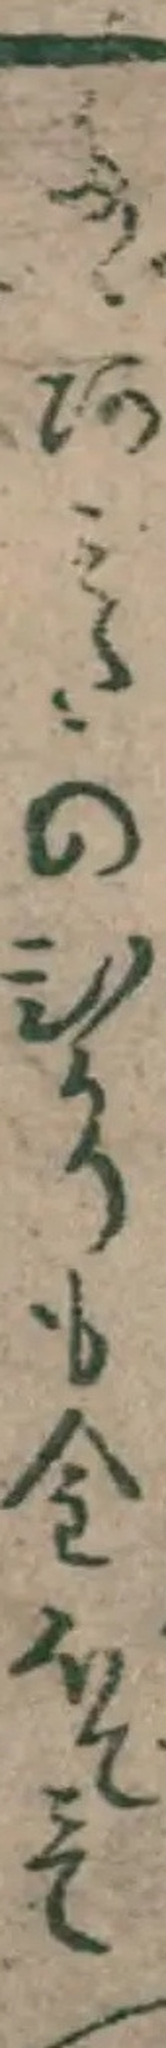たゞあみたのひかりも金ほどにて
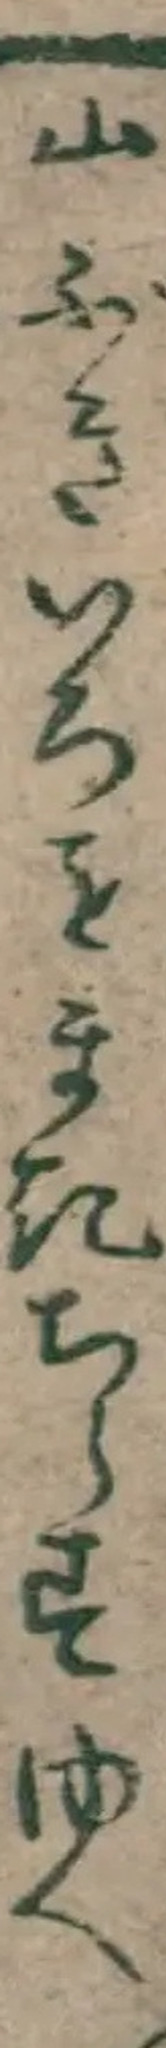山ぶきいろをまきちらすゆへ
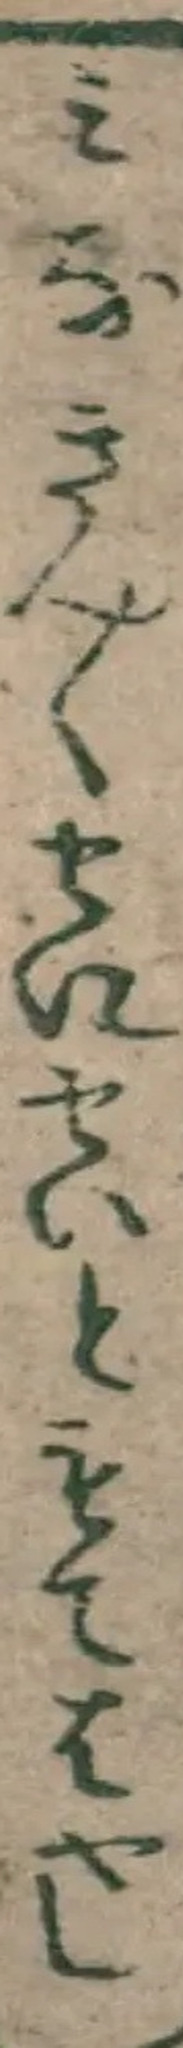みなきん〳〵せにせいともてはやし
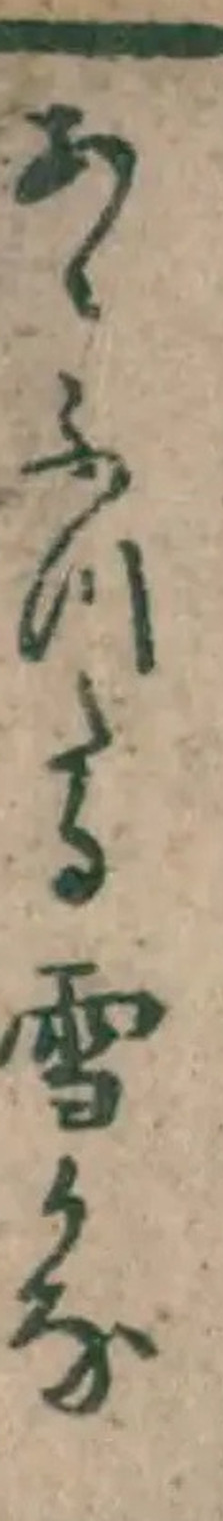あゝふつたる雪かな
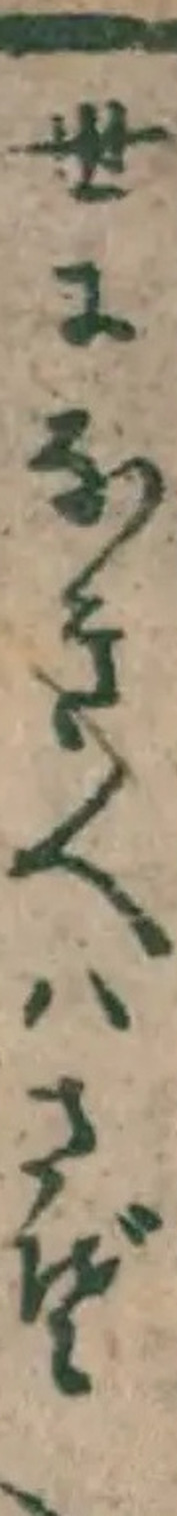世になき人はさぞ
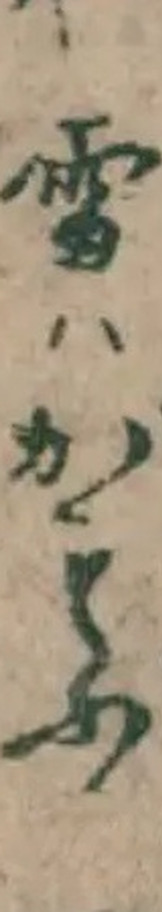雪はがもふ
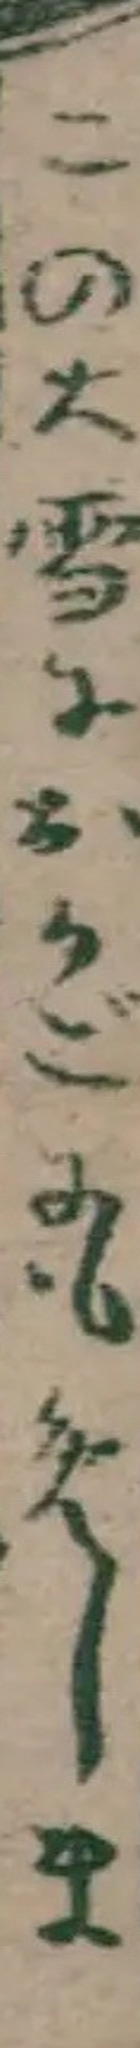この大雪におかごにもめしま
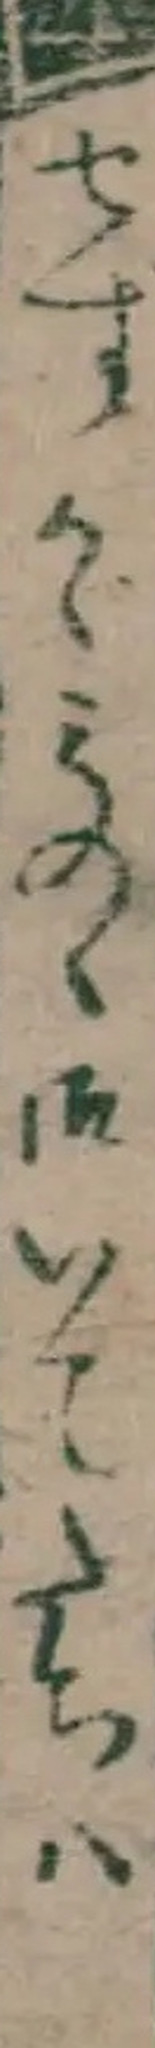せずかゞみのゝ御いてたちは
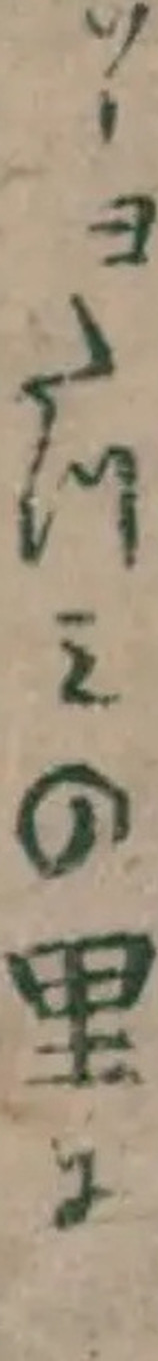ソーヨたつみの里に
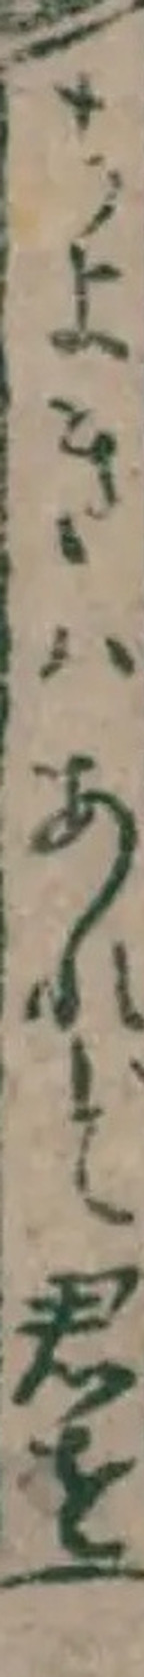ちよきはあれど君を
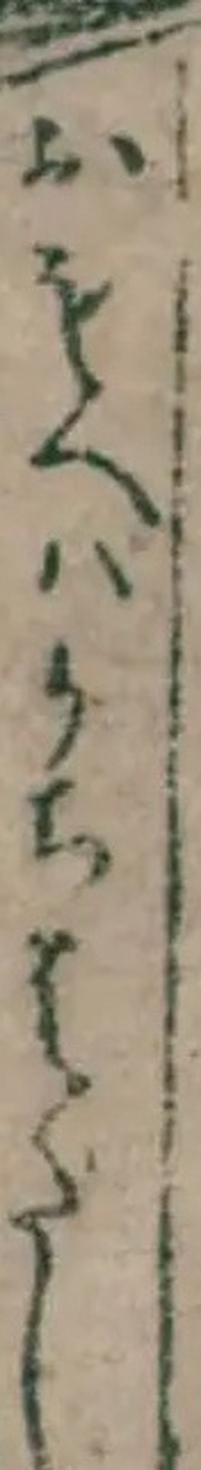おもへはかちはたしと
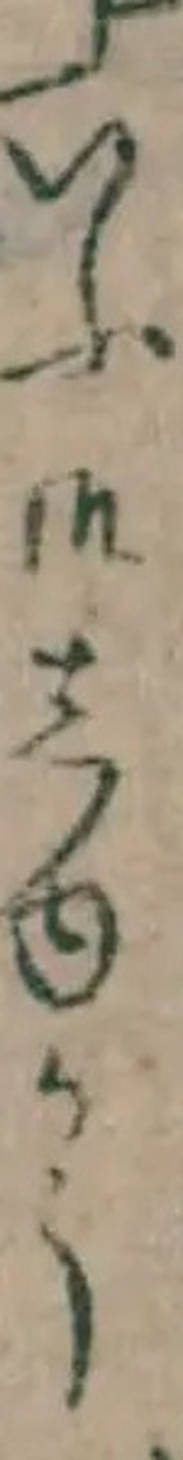いふ御しゆかう

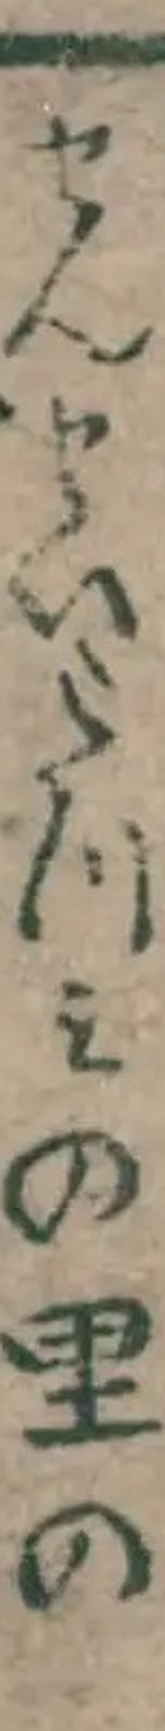せんせいたつみの里の
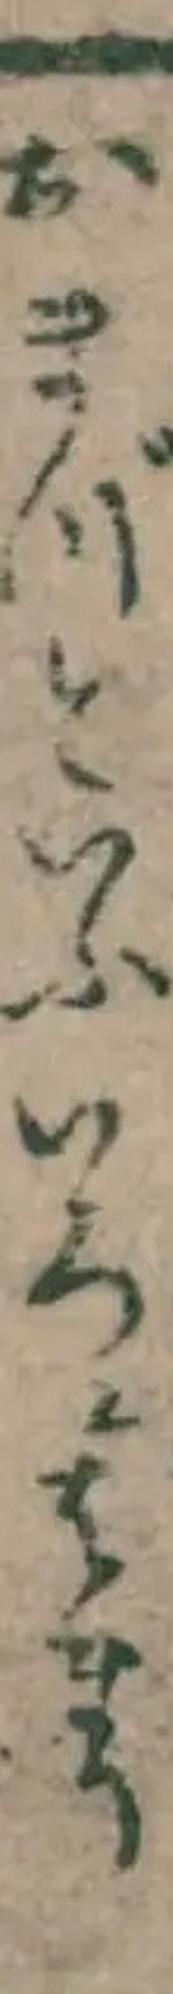おまづといふいろにはまり
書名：金々先生栄花夢 : 2巻
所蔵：国立国会図書館 National Diet Library, JAPAN
